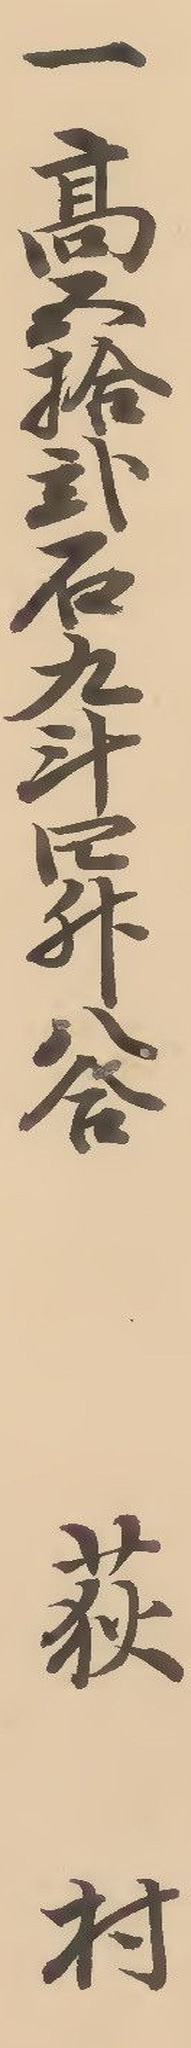一高五拾弐石九斗四升八合荻村

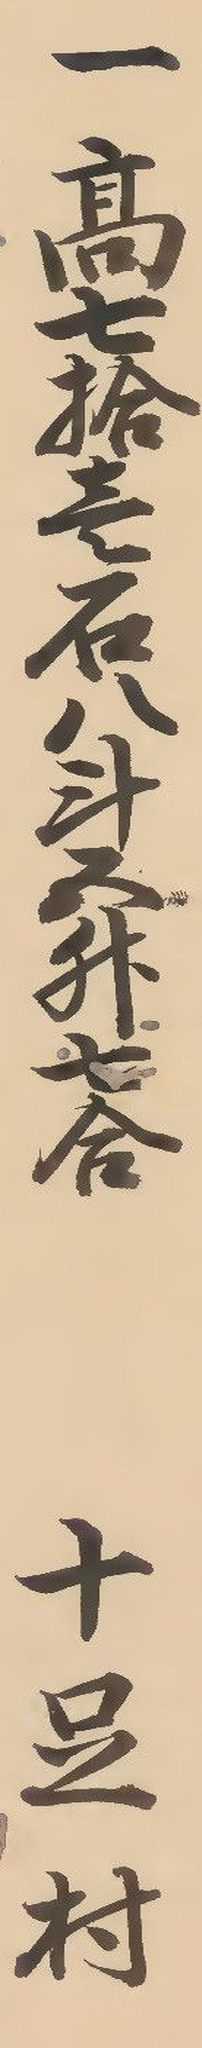一高七拾壱石八斗五升七合十足村
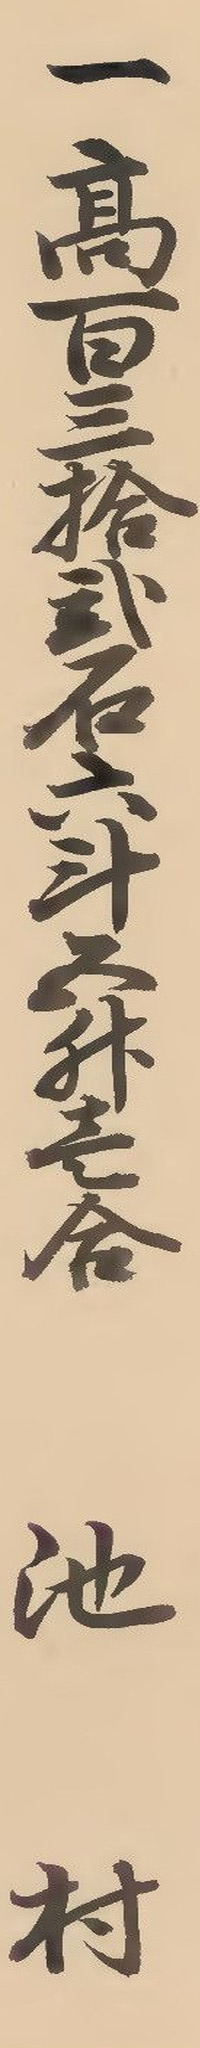一高百三拾弐石六斗五升壱合池村
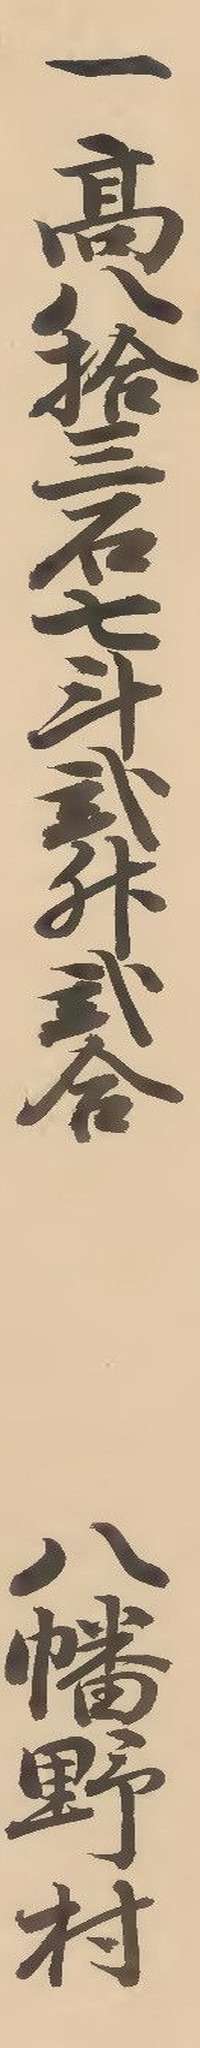一高八拾三石七斗弐升弐合八幡野村
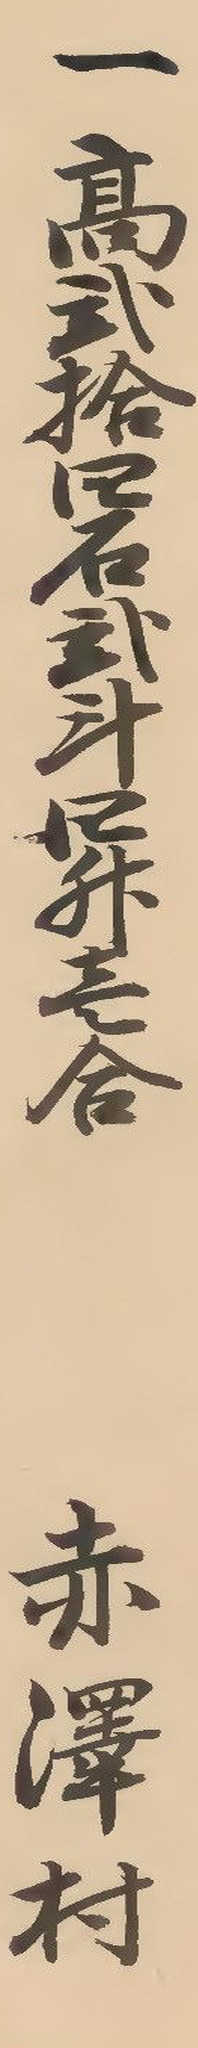一高弐拾四石弐斗四升壱合赤沢村
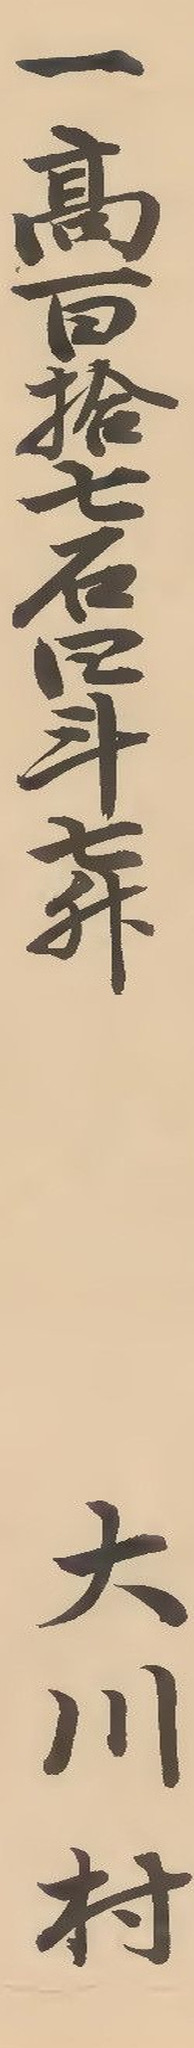一高百拾七石四斗七升大川村
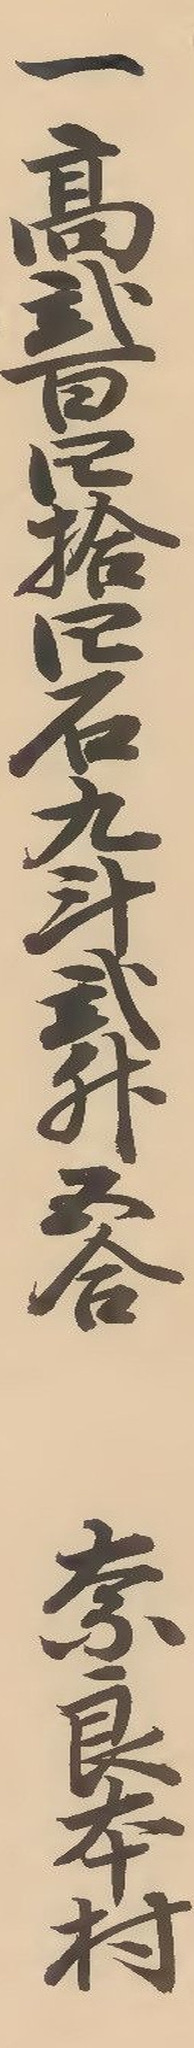一高弐百四拾四石九斗弐升五合奈良本村
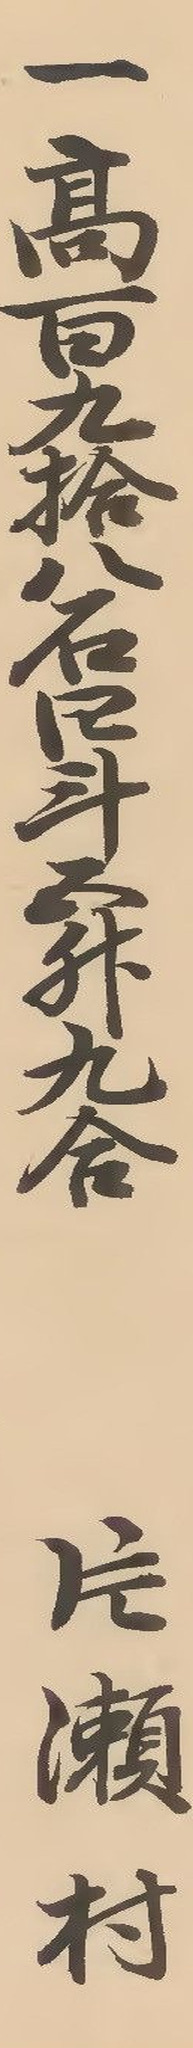一高百九拾八石四斗五升九合片瀬村
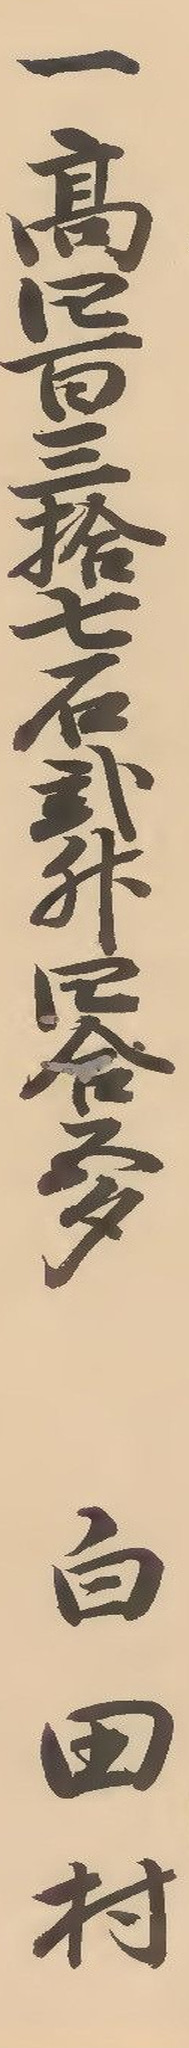一高四百三拾七石弐升四合五勺白田村

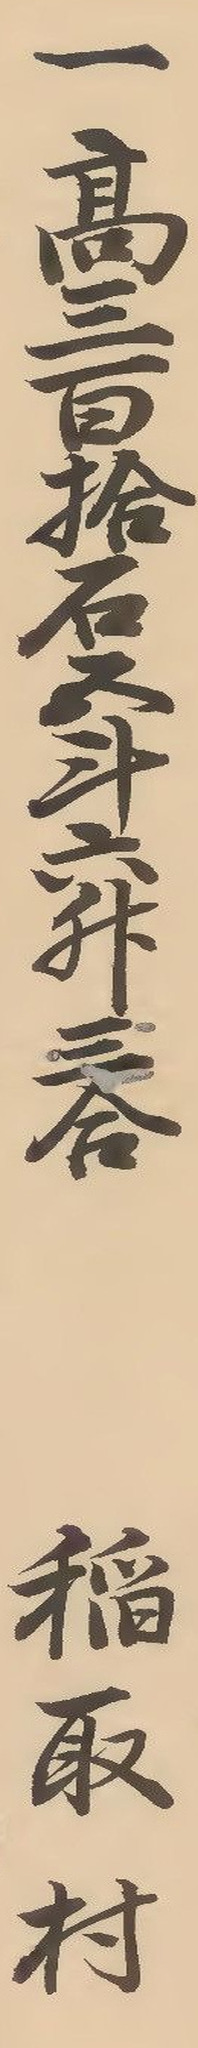一高三百拾石五斗六升三合稲取村
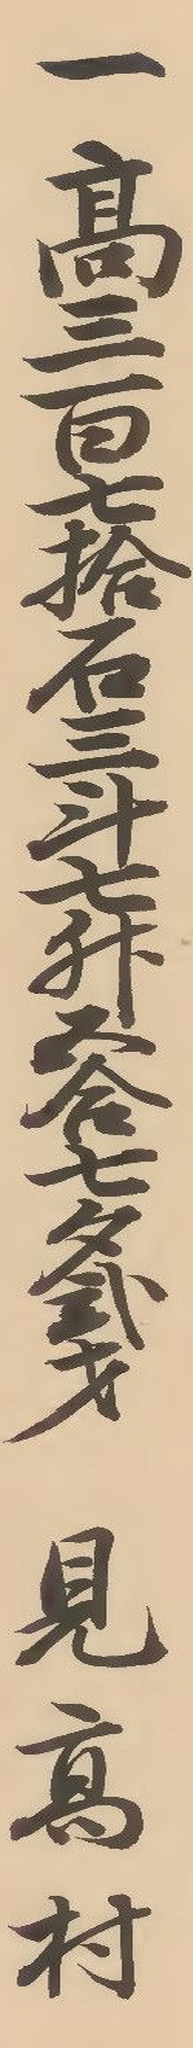一高三百七拾石三斗七升五合七勺弐才見高村
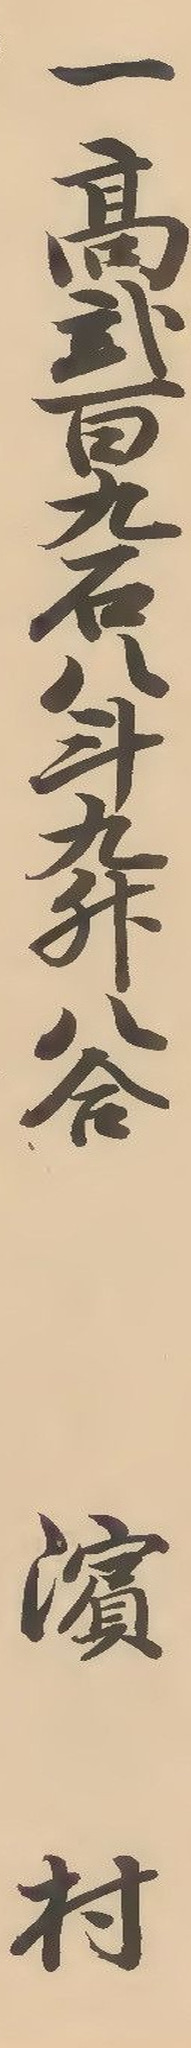一高弐百九石八斗九升八合浜村
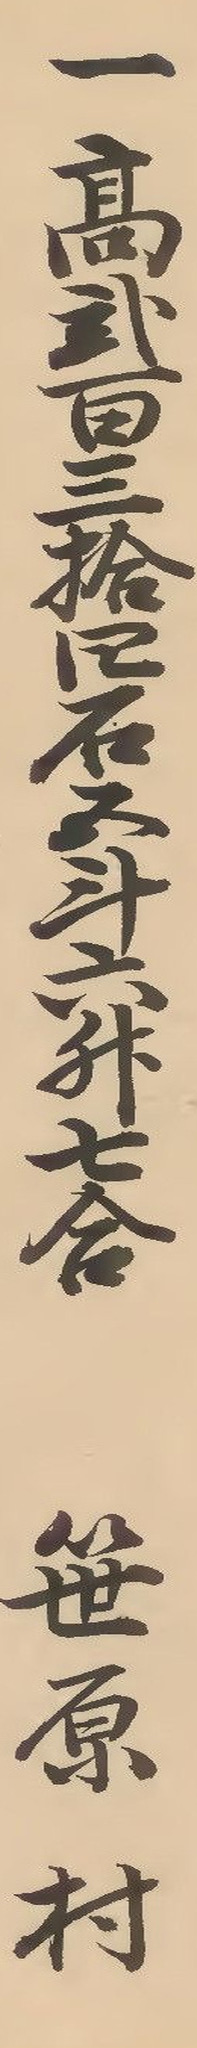一高弐百三拾四石五斗六升七合笹原村
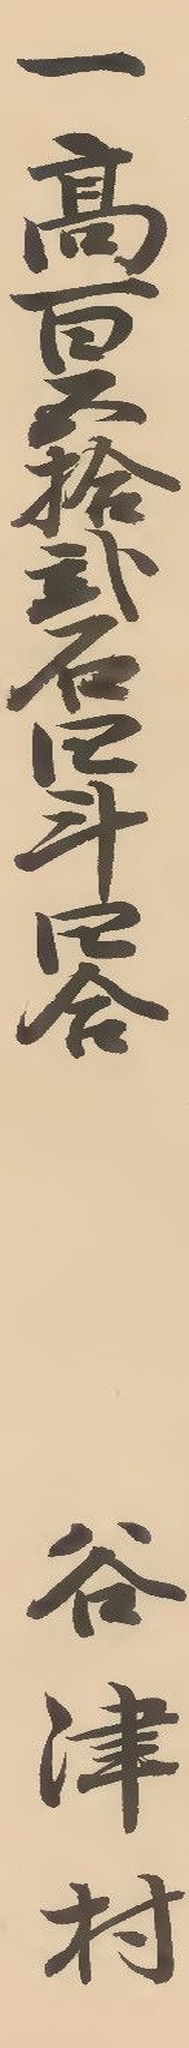一高百五拾弐石四斗四合谷津村
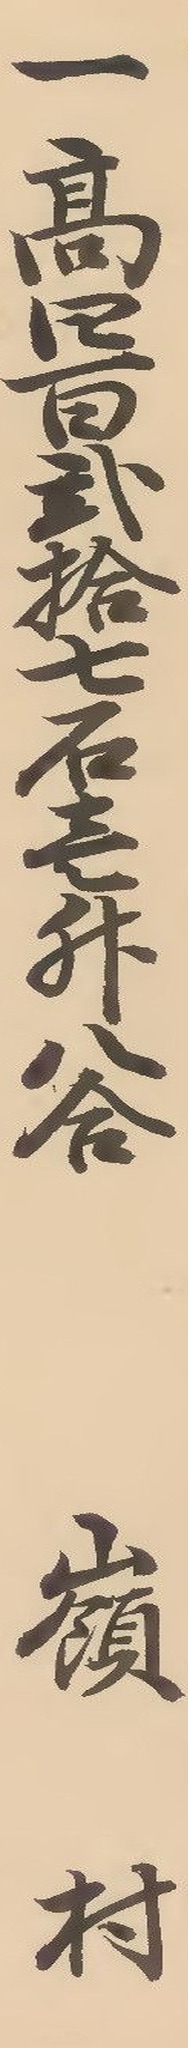一高四百弐拾七石壱升八合峰村
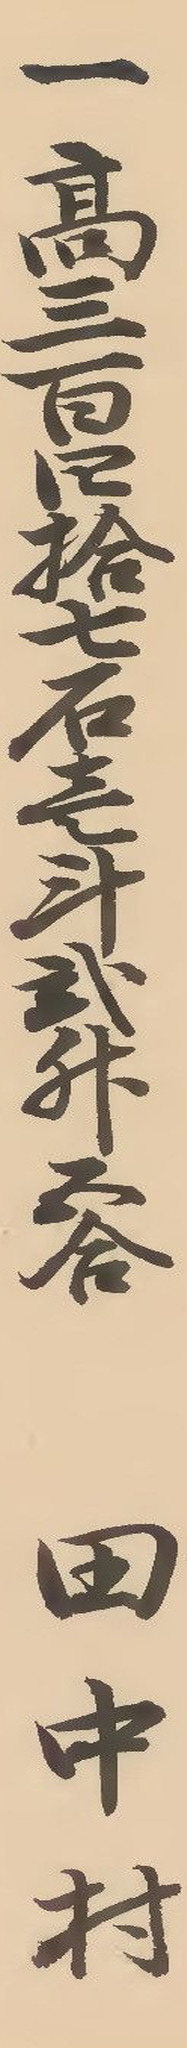一高三百四拾七石壱斗弐升五合田中村
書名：伊豆国郷帳
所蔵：国立公文書館 National Archives of Japan
